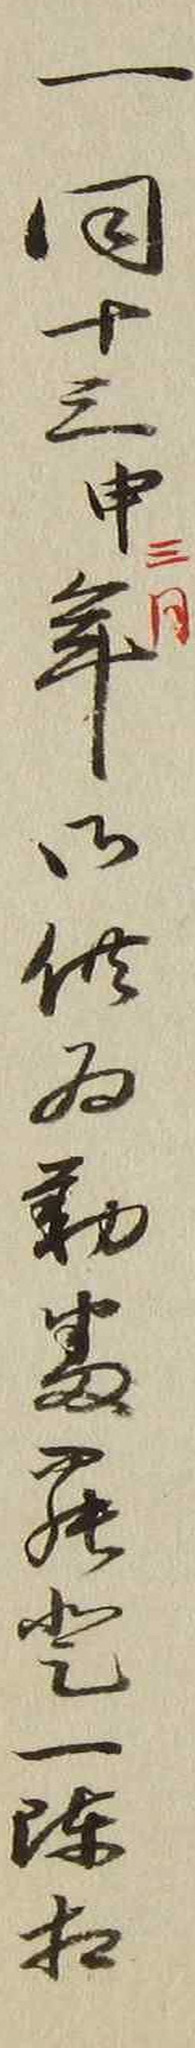一同十三申年三月御供為勤番罷登一陣相
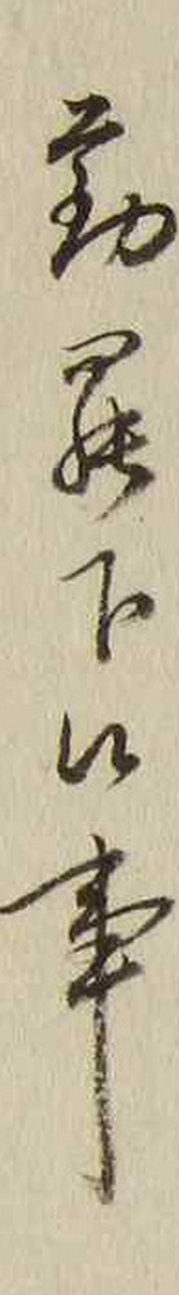勤罷下候事
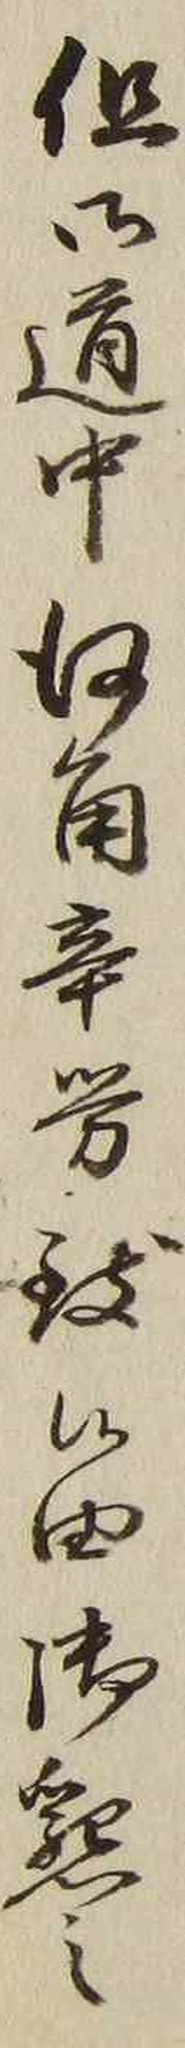但御道中何角辛労致候由御懇之
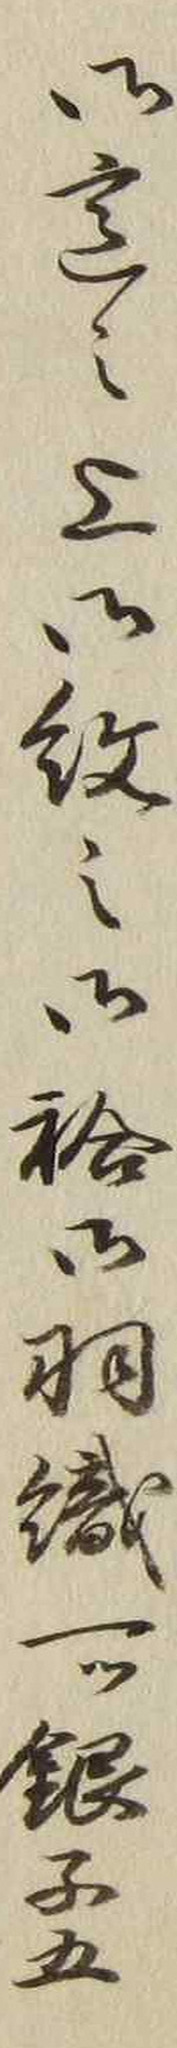御意之上御紋之御袷御羽織一つ銀子五

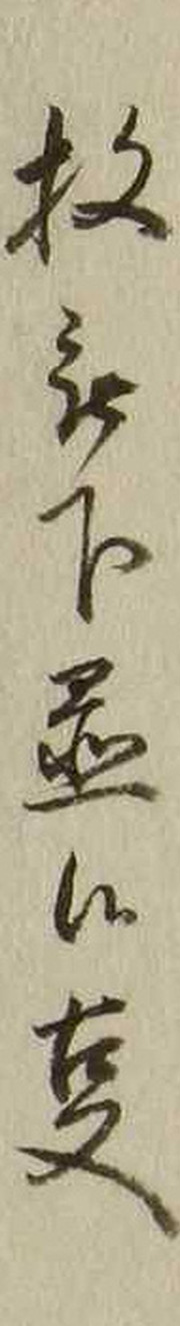枚被下置候㕝
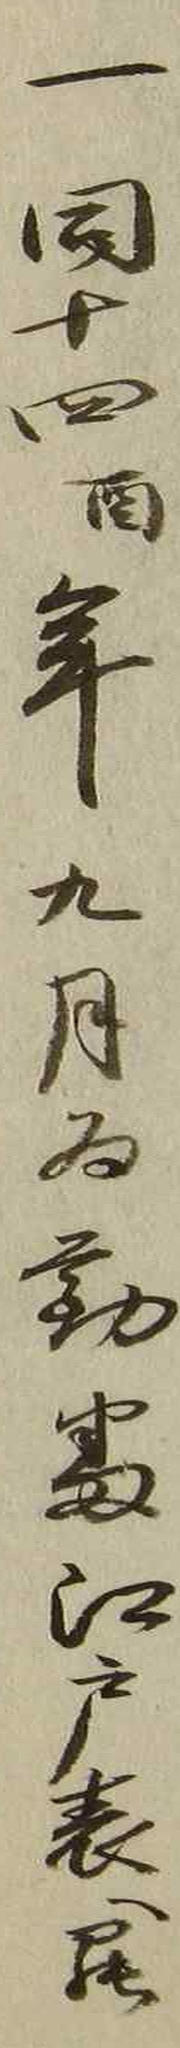一同十四酉年九月為勤番江戸表罷
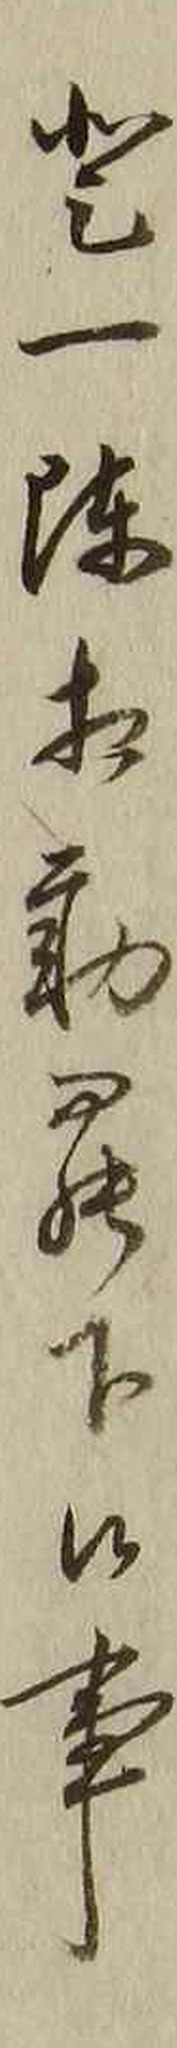登一陣相勤罷下候事
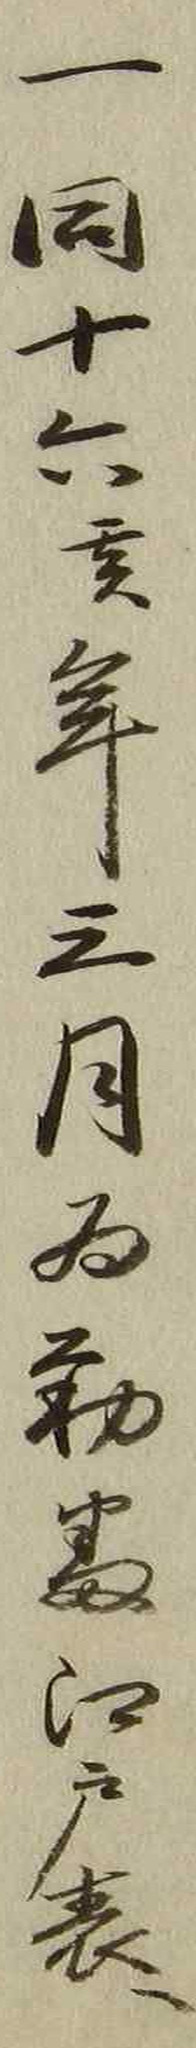一同十六亥年三月為勤番江戸表へ
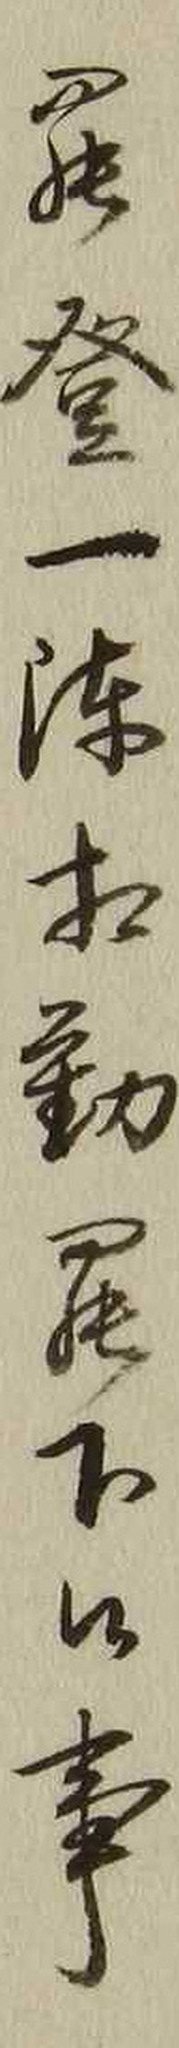罷登一陣相勤罷下候事
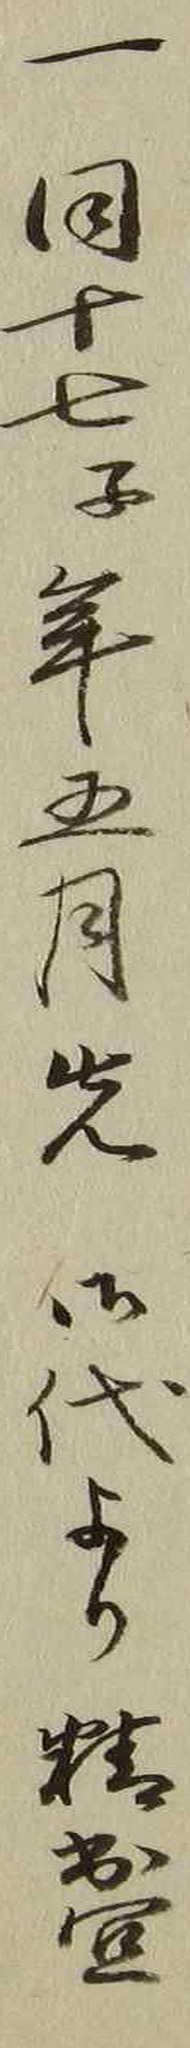一同十七子年五月先御代より精出宜
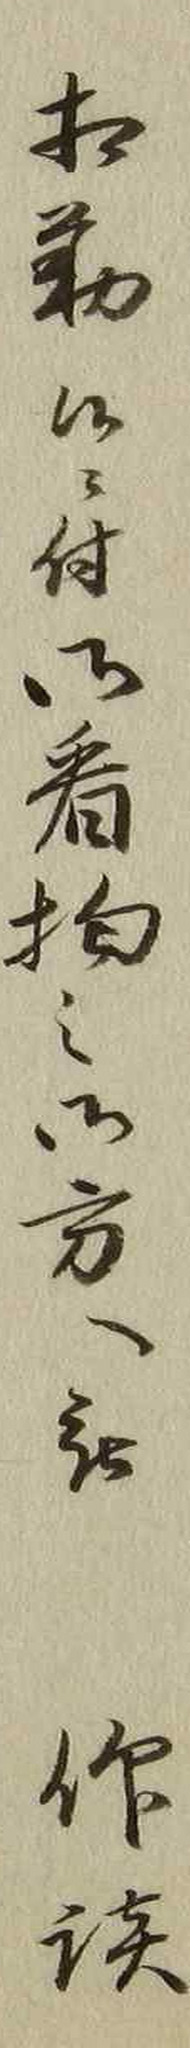相勤候に付御看拘之御方へ被仰談
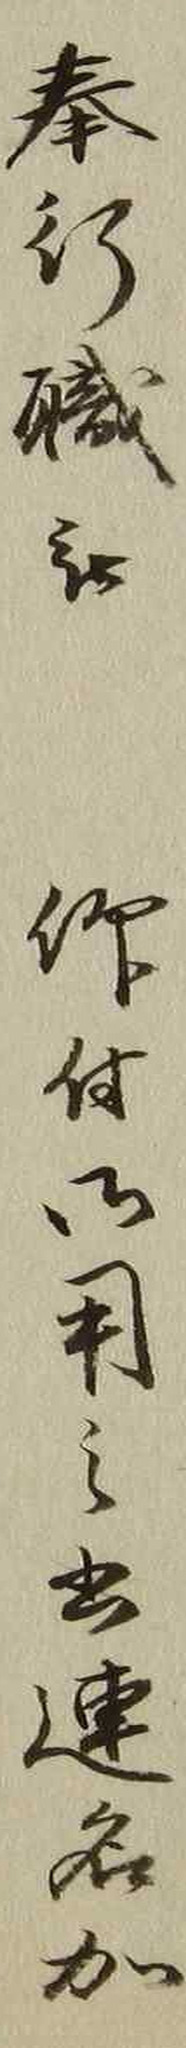奉行職被仰付御用之書連名加
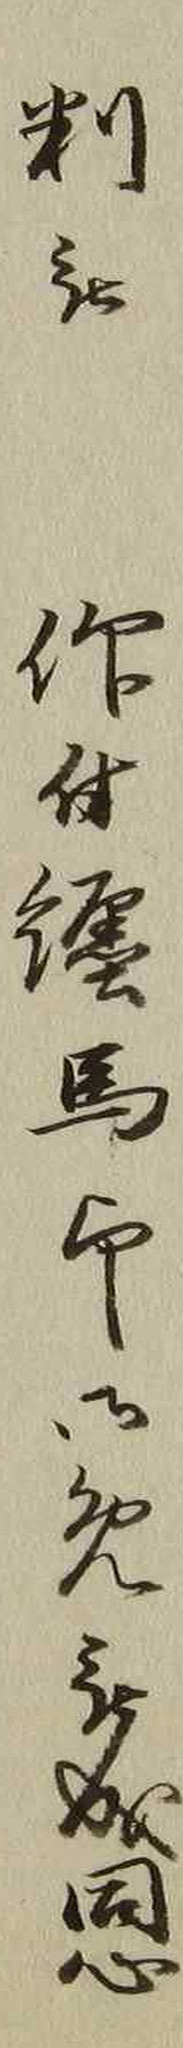判被仰付纏馬印御免被成同心
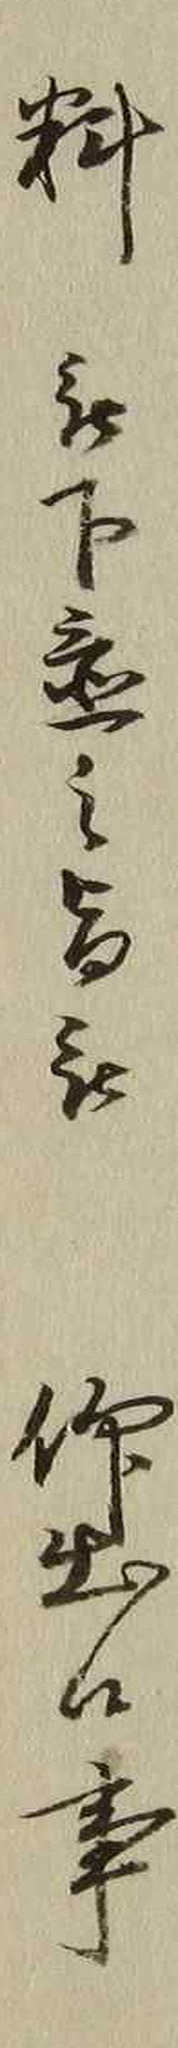料被下置之旨被仰出候事
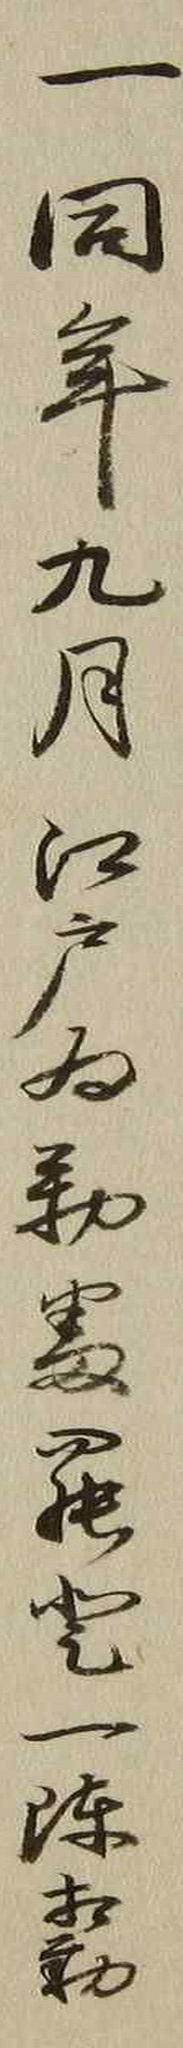一同年九月江戸為勤番罷登一陣相勤
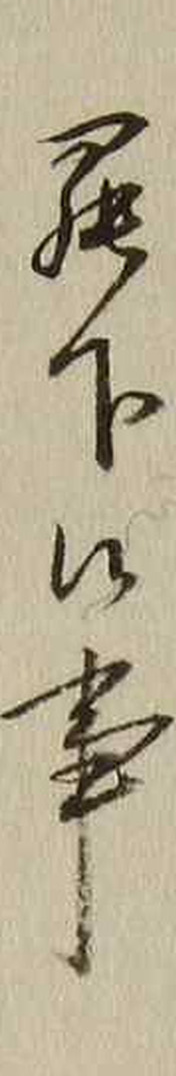罷下候事
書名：諸士系譜　巻之133　た之部9
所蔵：会津若松市立会津図書館
